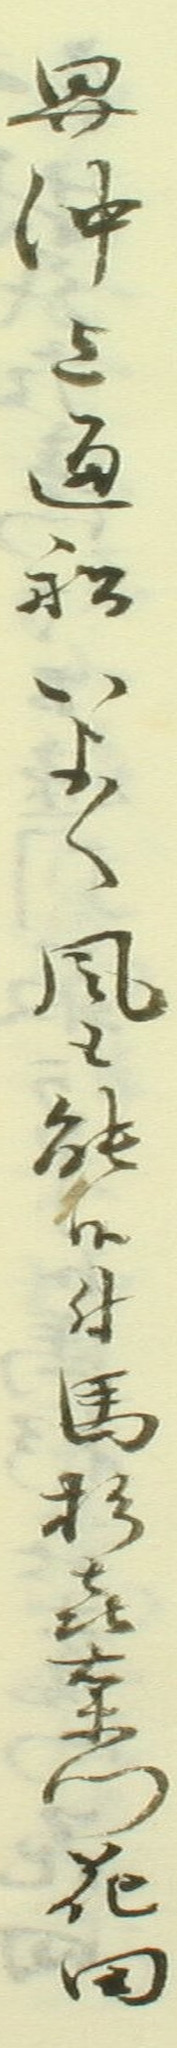界仲迄通船いよ〳〵風も能候に付馬杉喜右衛門花田
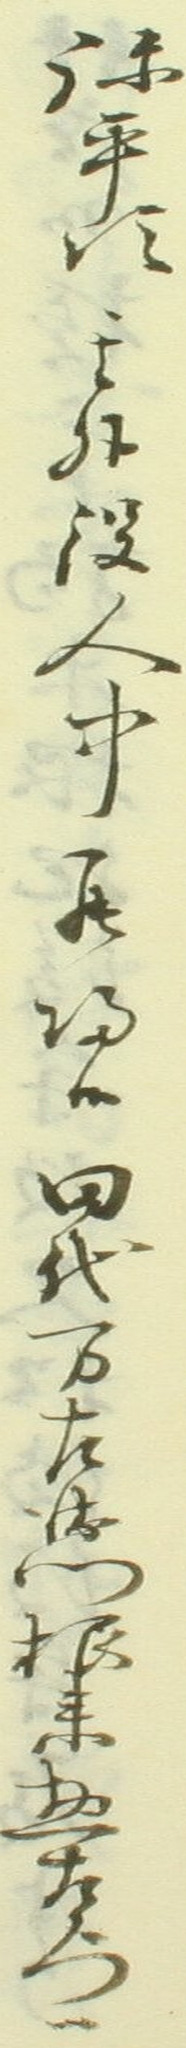弥平次其外役人中罷帰候田代万左衛門根来惣左衛門は
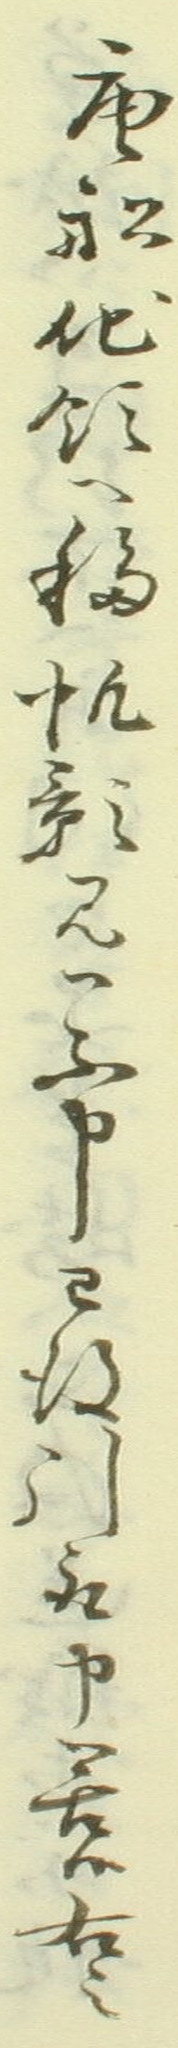唐船他領へ移帆影見へ不申已後引取申筈候右之
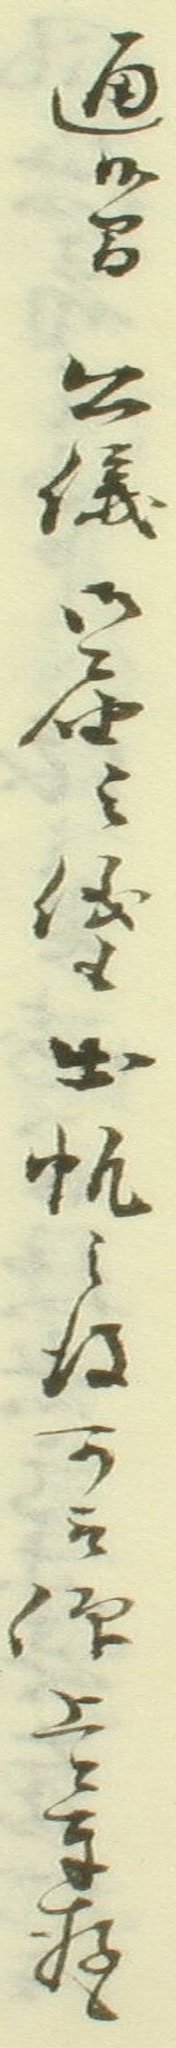通候間公儀御届之儀も出帆之後可被仰上と奉存候
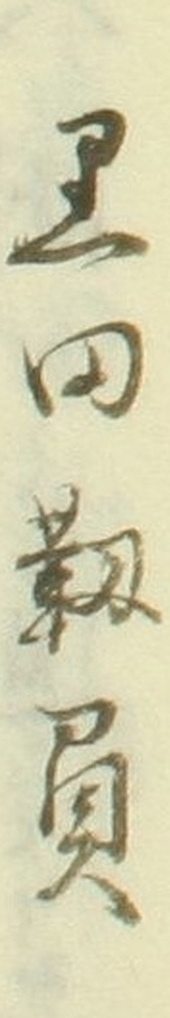黒田靭負
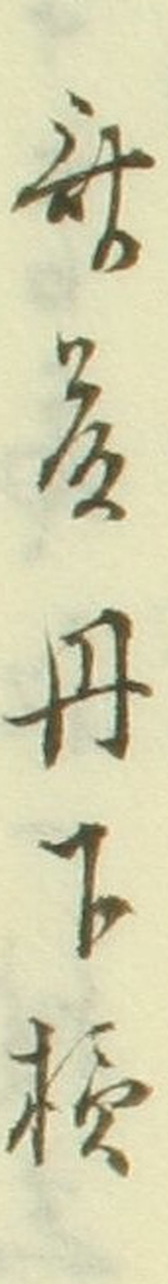斉藤丹下様
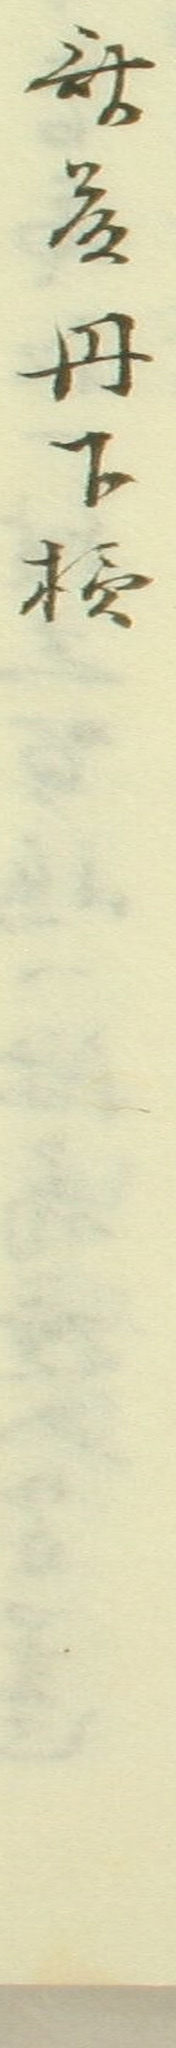斉藤丹下様
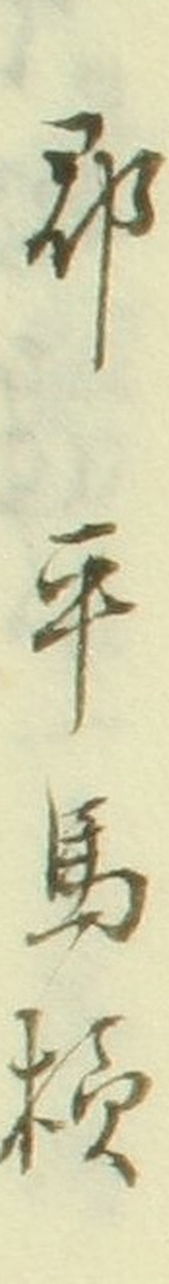郡平馬様
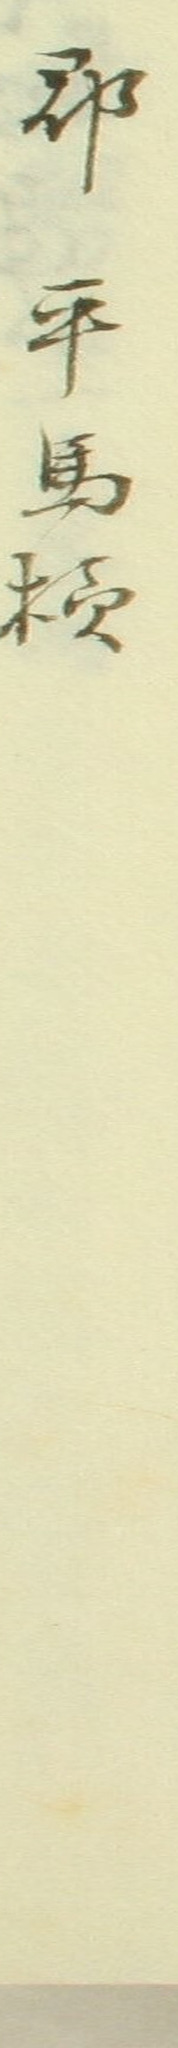郡平馬様
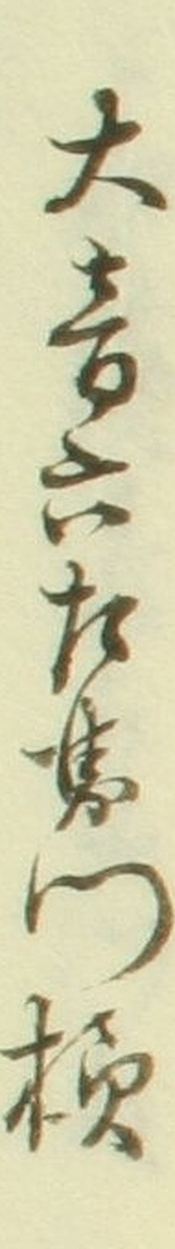大音六左衛門様

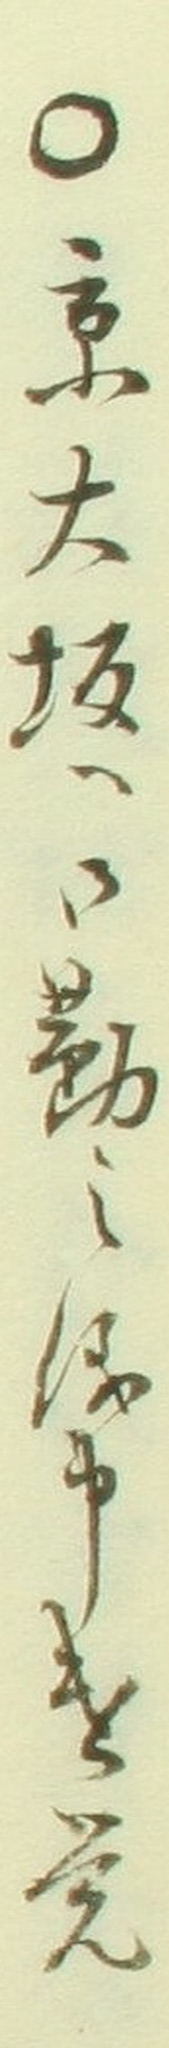〇京大坂へ御勤之儀申遣覚
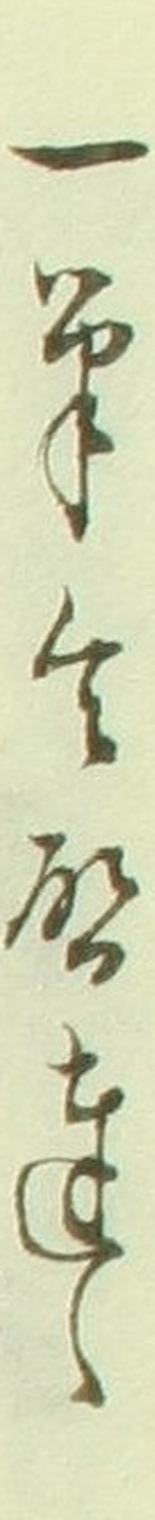一筆令啓達候
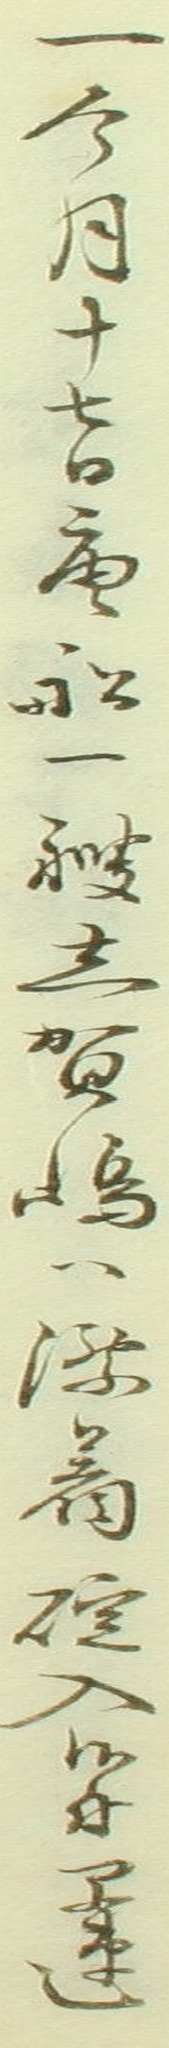一今月十七日唐船一艘志賀島へ漂着碇入候付早速
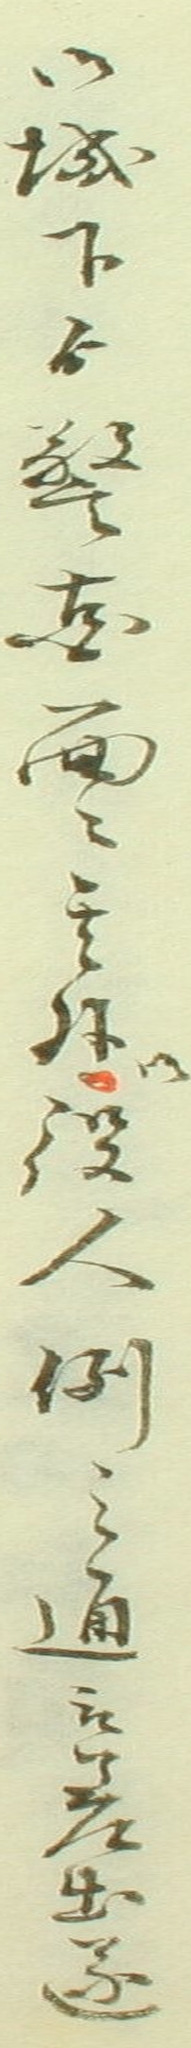御城下ゟ警固面々其外◦役人例之通被差出遂
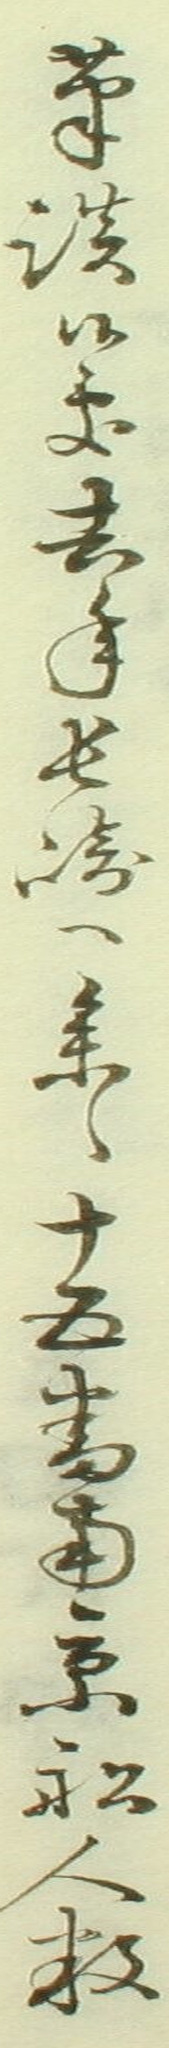筆談候処去年長崎へ参候十五番南京船人数
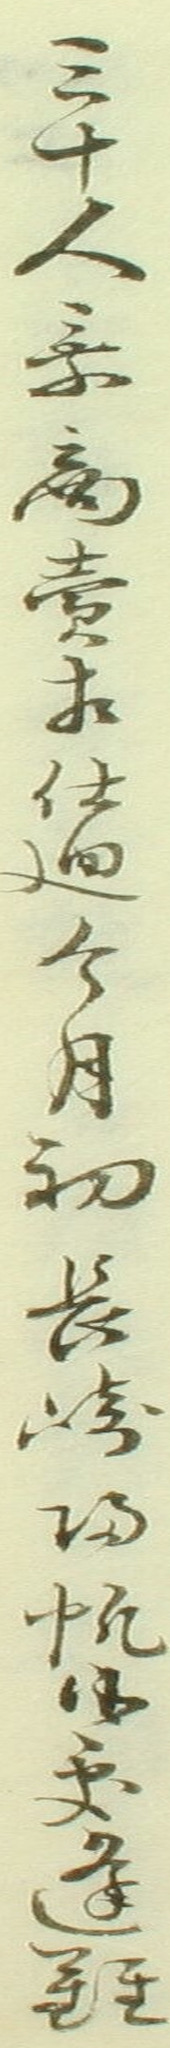三十人乗商売相仕廻今月初長崎帰帆候処逢難
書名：異国船漂着記
